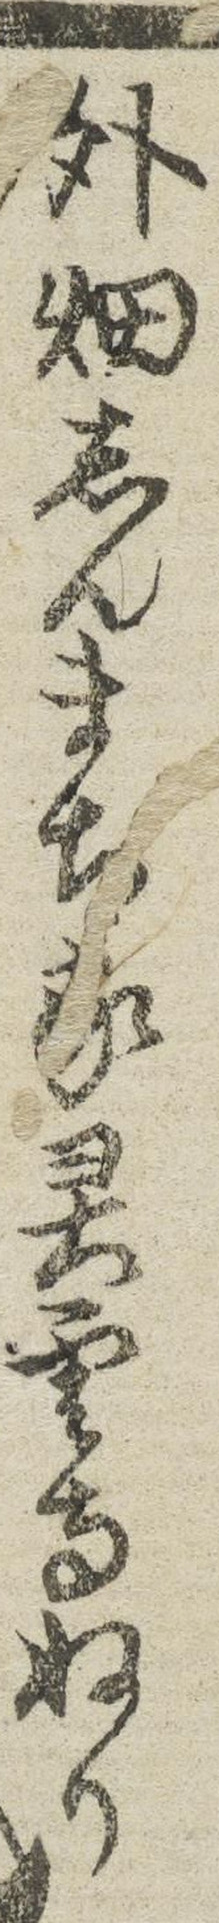外畑しんまち家霊雲寺ねり
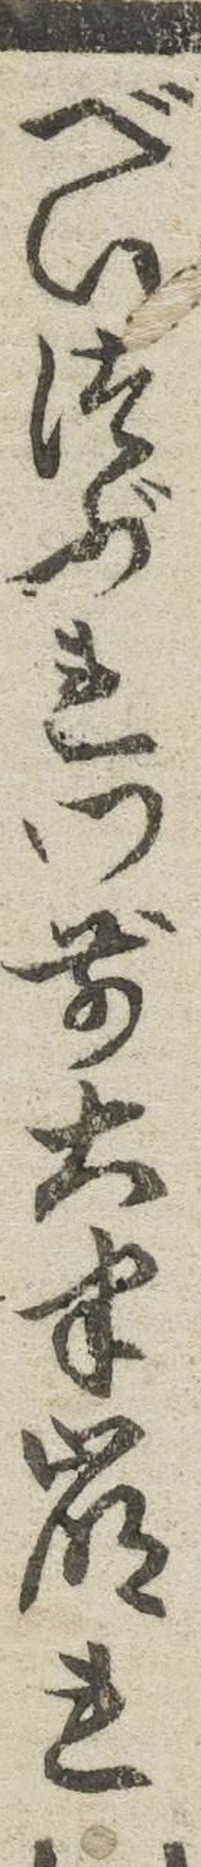べいつぶれ門前大半崩れ
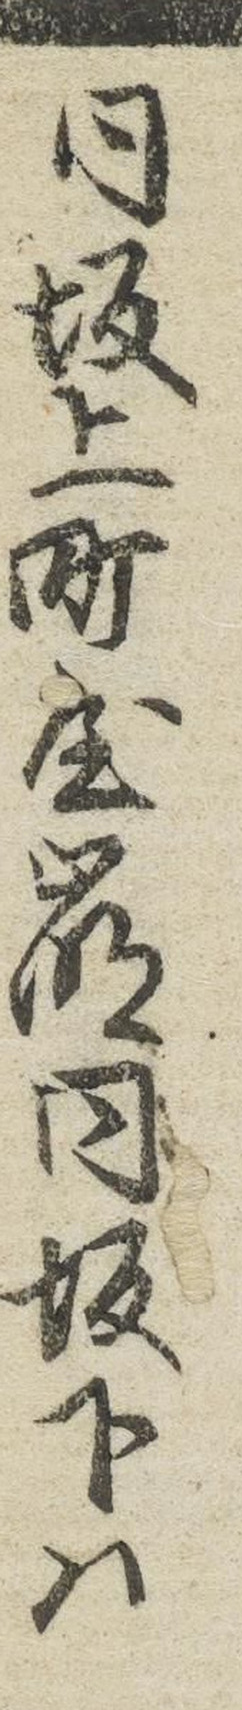同坂上町屋崩同坂下ハ
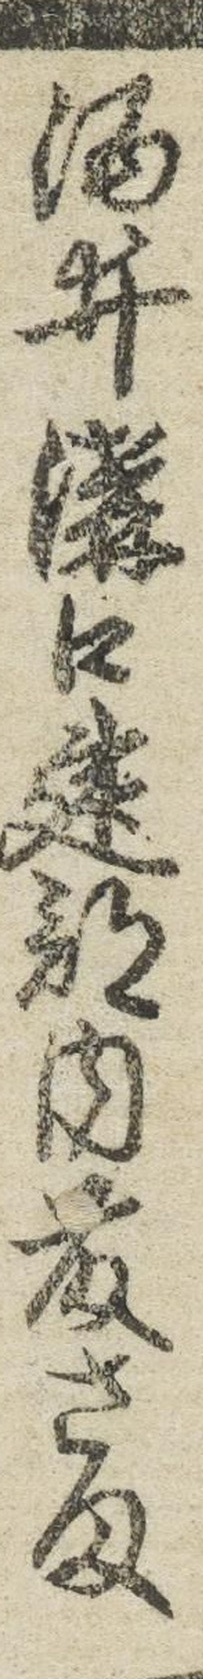酒井溝口建部内藤さま
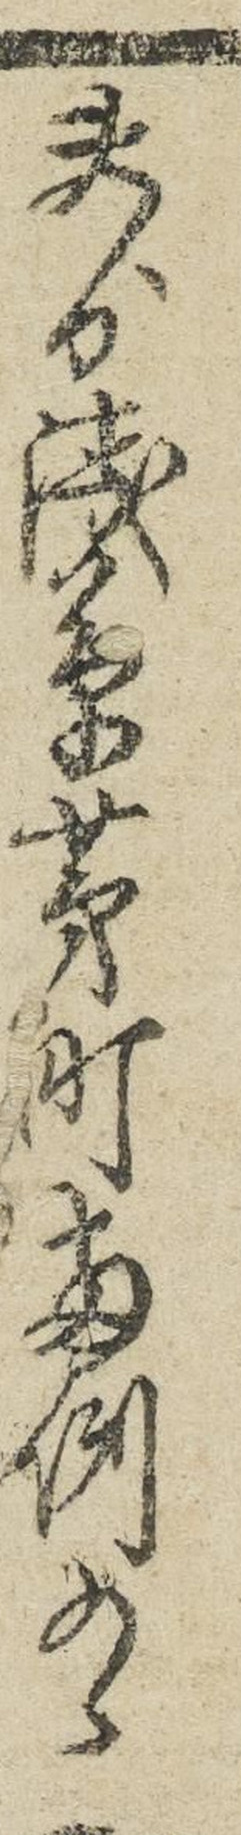夫ゟ浅草茅町両側少ゝ
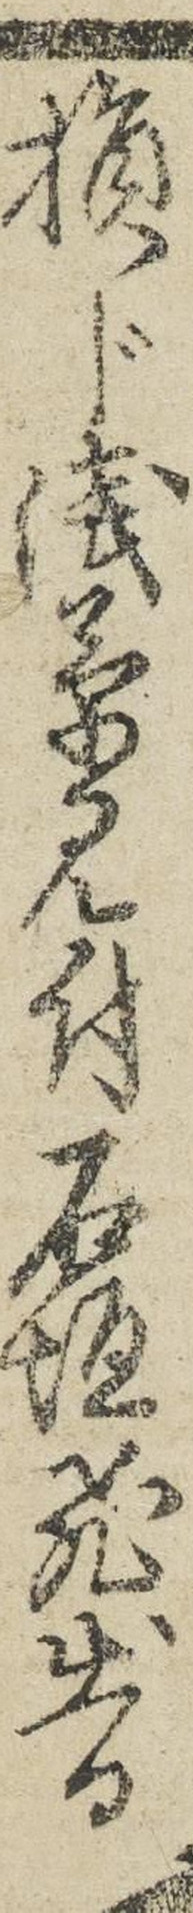損じ浅草見付石垣飛出る
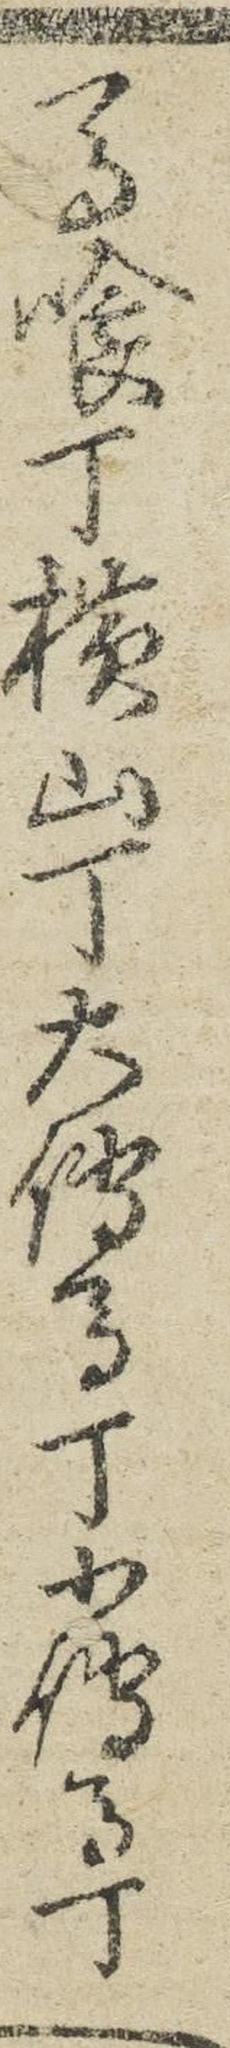馬喰丁横山丁大伝馬丁小伝馬丁
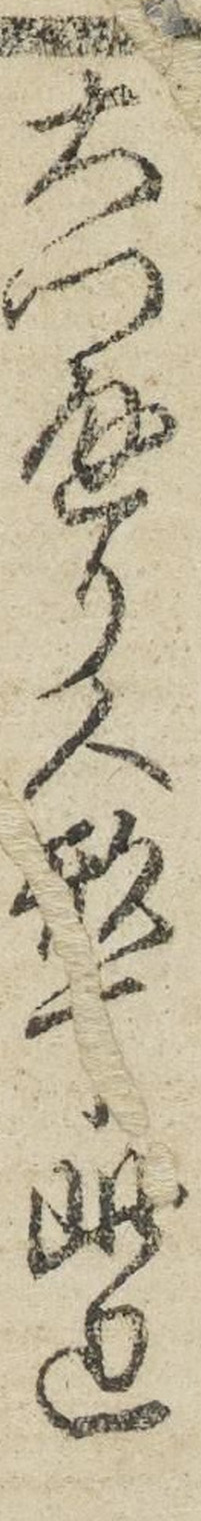大門通り人形丁此辺
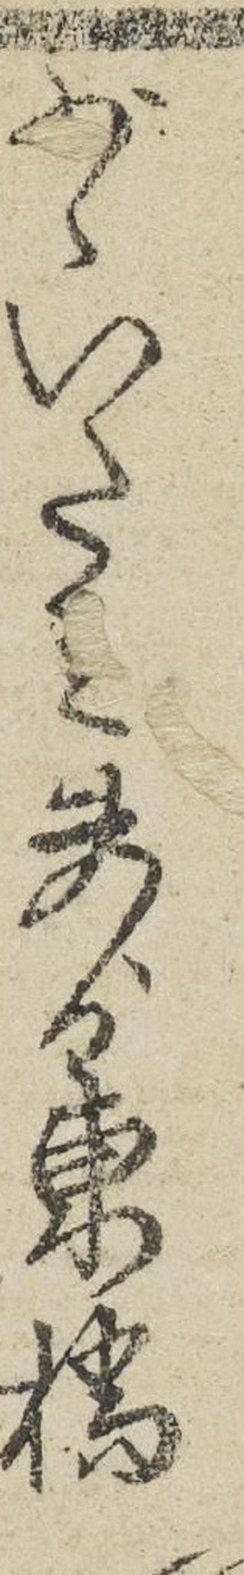少々いたミ夫ゟ東橋
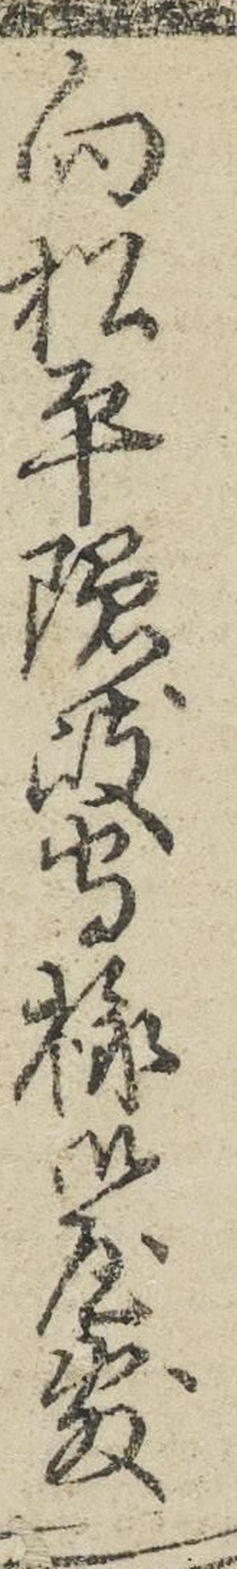向松平隠岐守様御屋敷
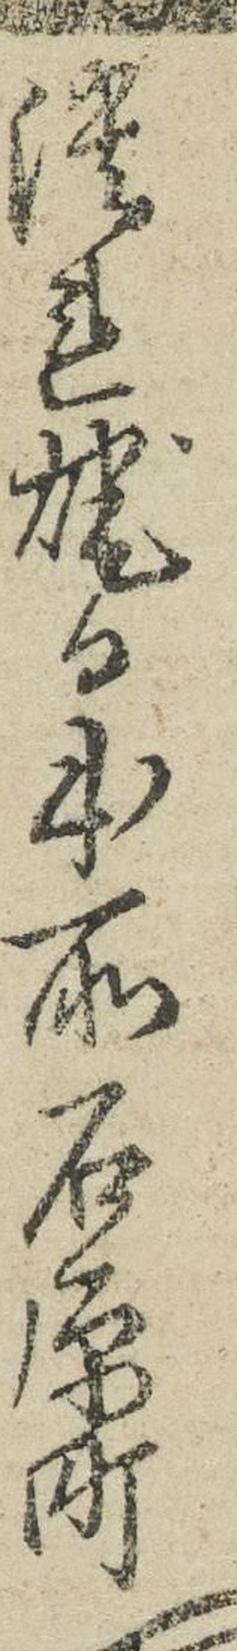潰れ焼る本所石原町
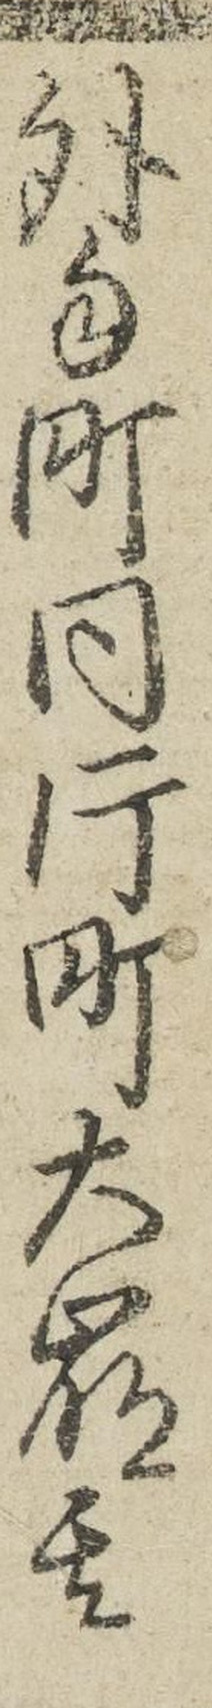外手町同片町大崩其

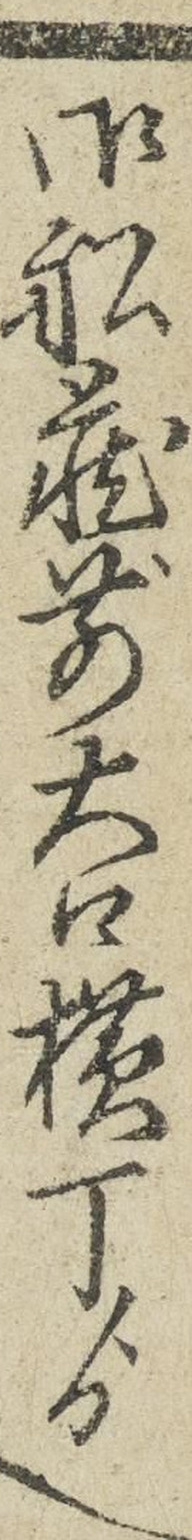御船蔵前大口横丁ゟ
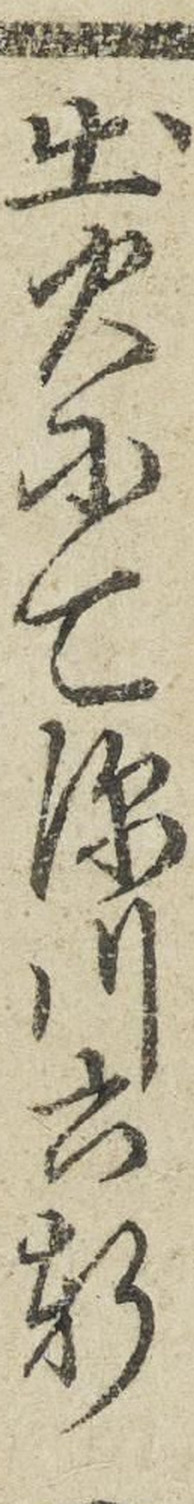出火にて深川六軒
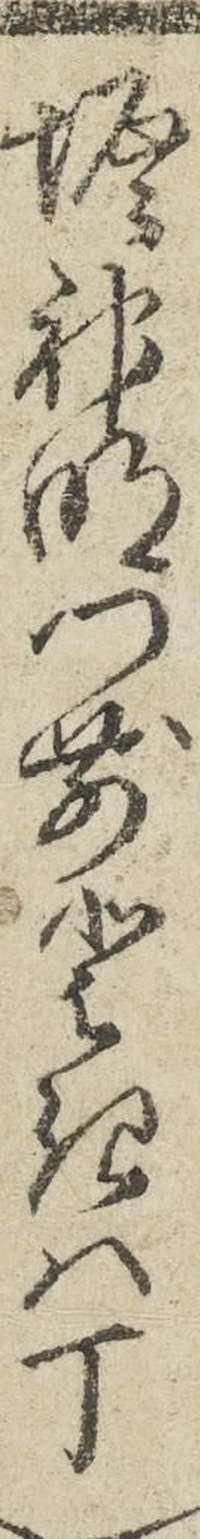堀神明門前ときは丁
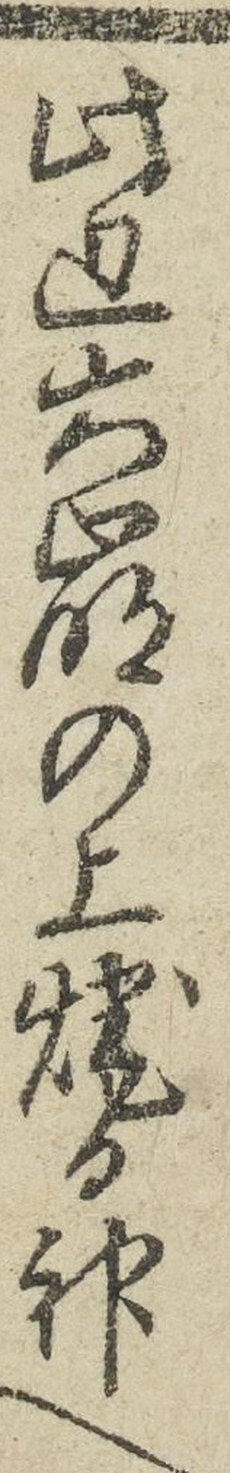此辺大崩の上焼る神
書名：関東五街道　江戸大地震出火場所
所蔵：東京大学地震研究所図書室 Earthquake Research Institute Library, The University of Tokyo, JAPAN
